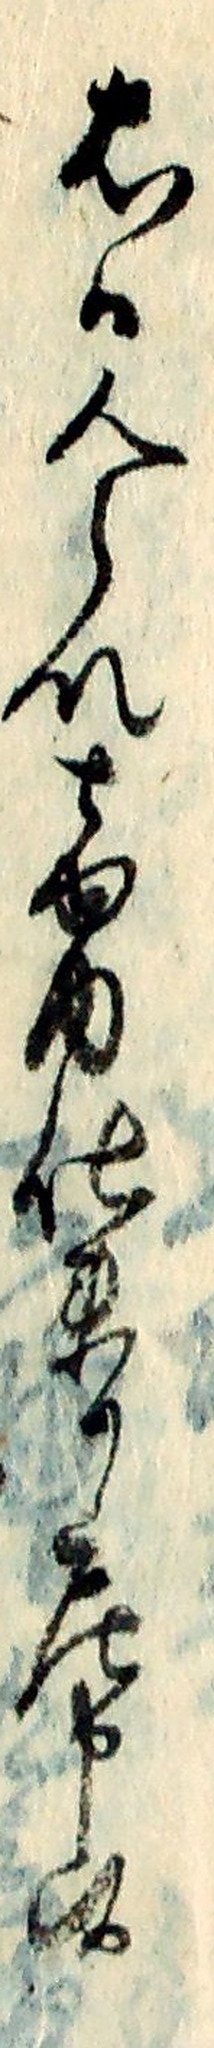右は今以商内仕来り居申候
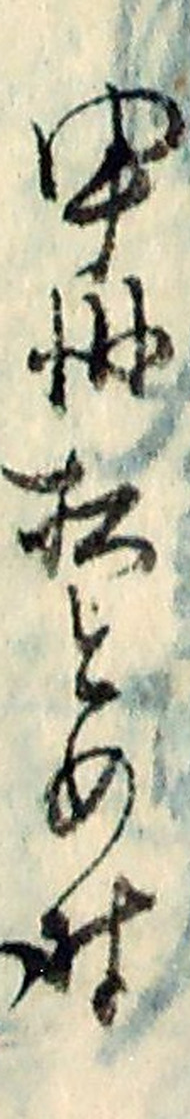甲州松とめ村
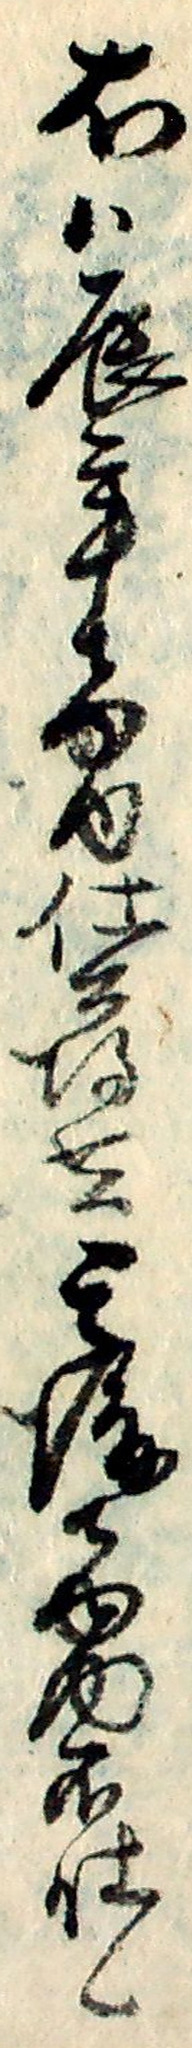右は辰年商内仕候得共其後商内不仕候
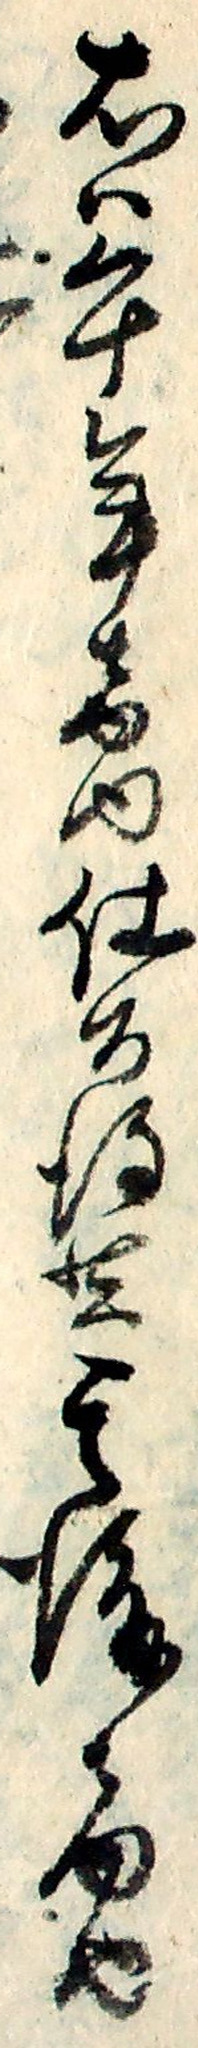右は午年商内仕候得共其後商内
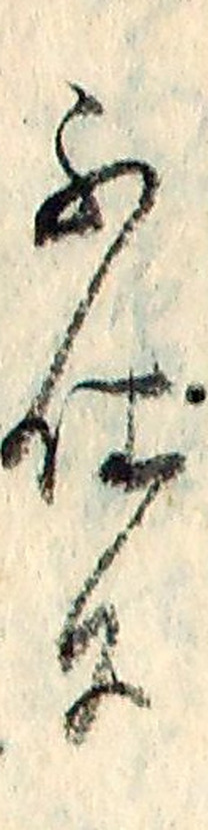不仕候

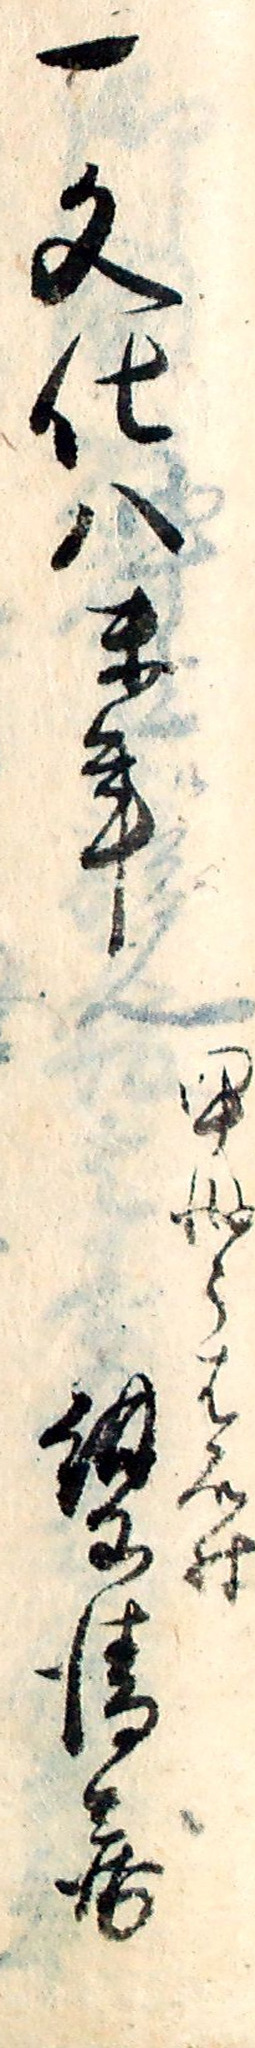一文化八未年紺屋清兵衛
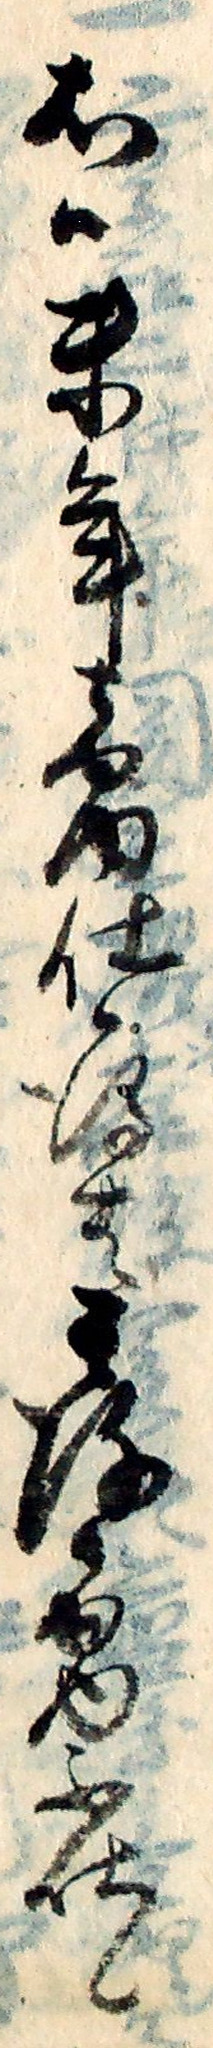右は未年商内仕候得共其後商内不仕候
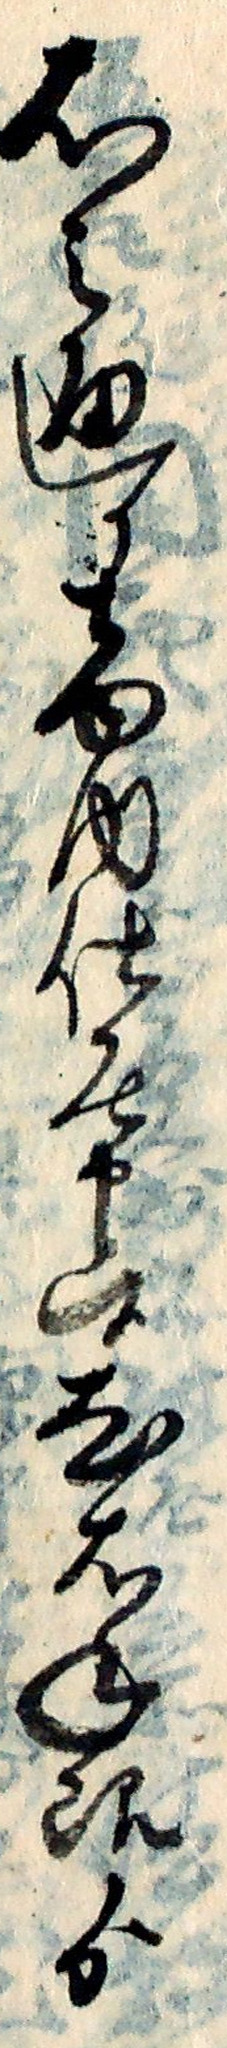右之通り商内仕居申候尤右年限ゟ
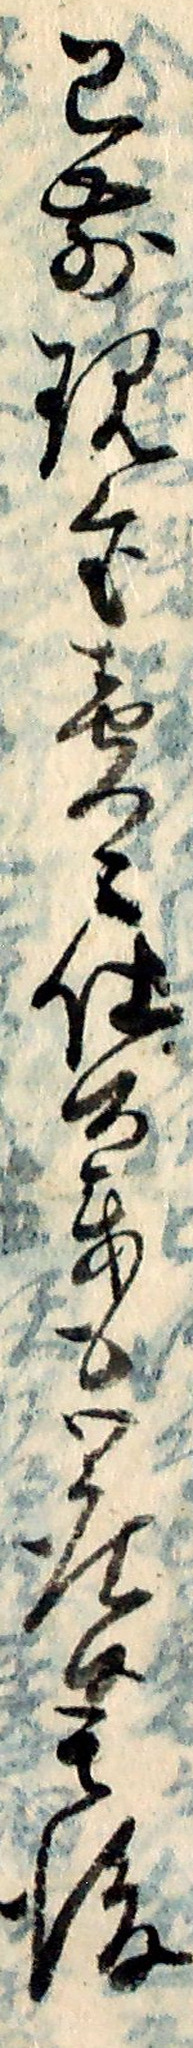已前現金売に仕候義も御座候其後
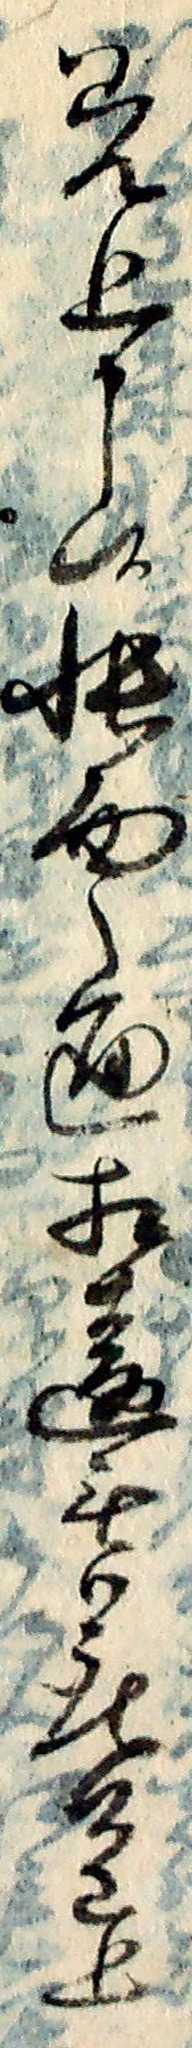差上申候帳面之通相違無御座候已上
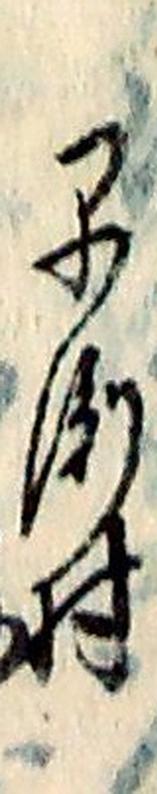早淵村
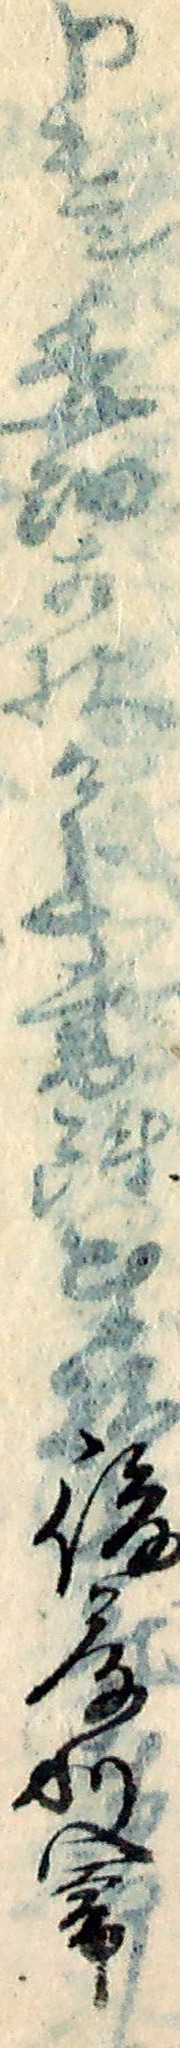後藤利八郎
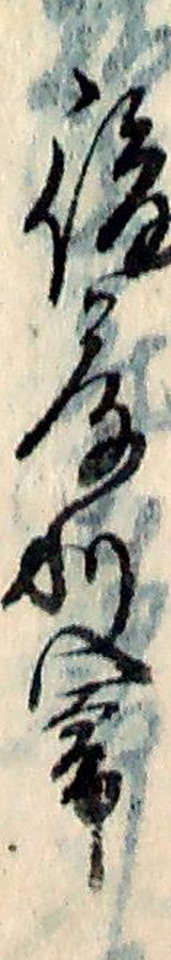後藤利八郎
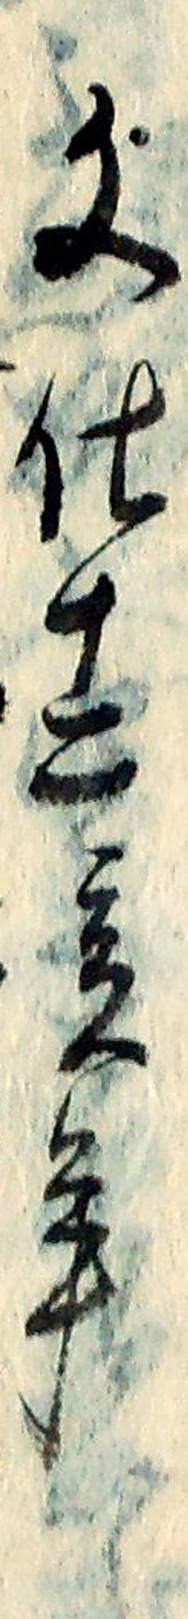文化十二亥年
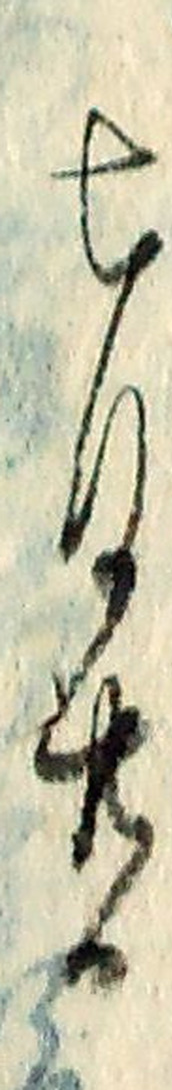七月廿日
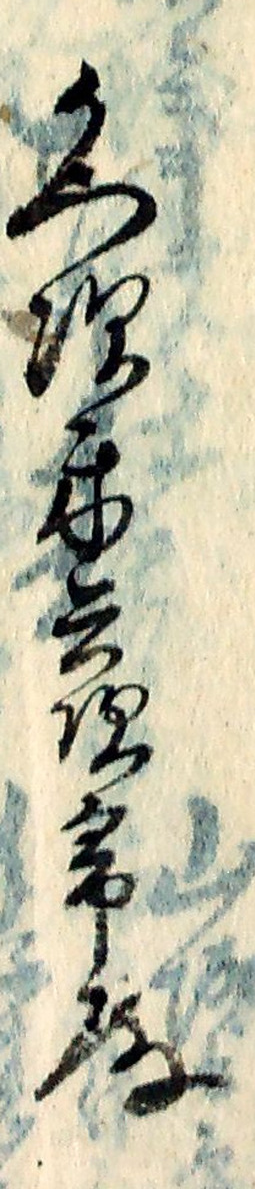久須米兵次郎殿
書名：諸御願書控(後藤氏壱番）
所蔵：鳴門教育大学 Naruto University of Education
